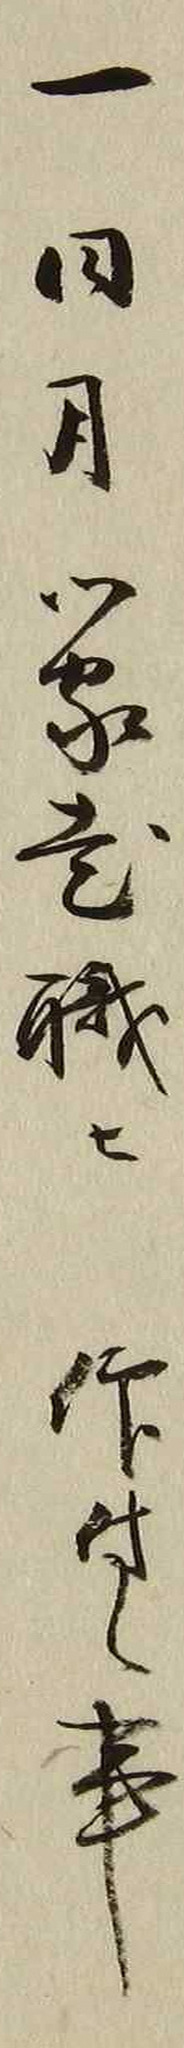一同月御家老職被仰付候事
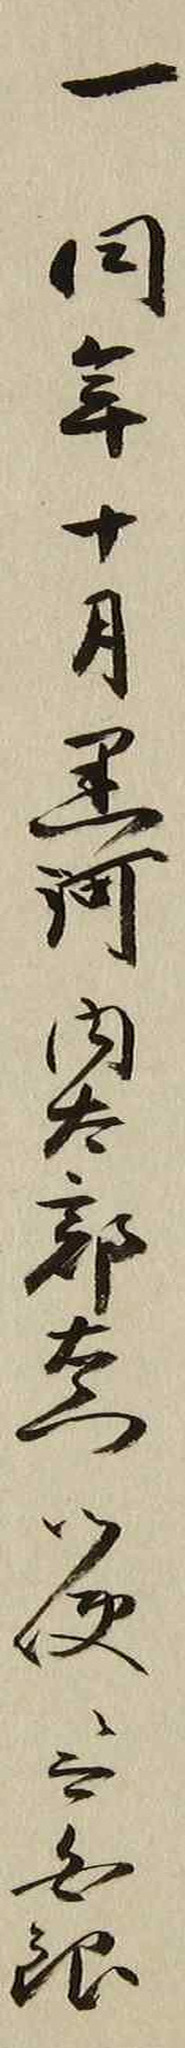一同年十月黒河内太郎右衛門御使に而白銀
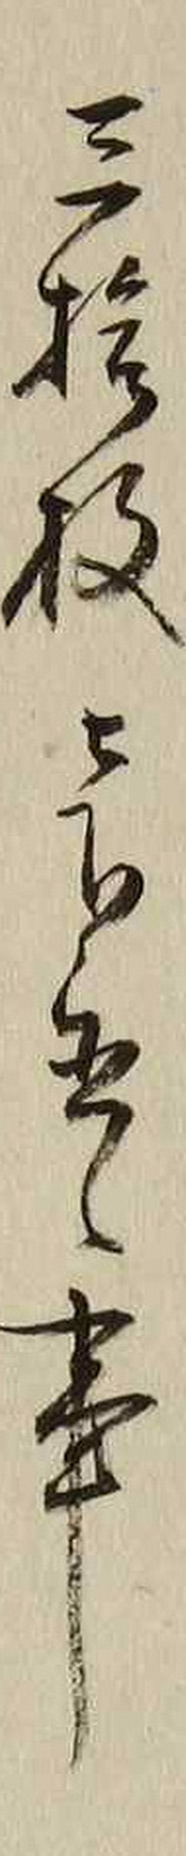三拾枚被下置候事
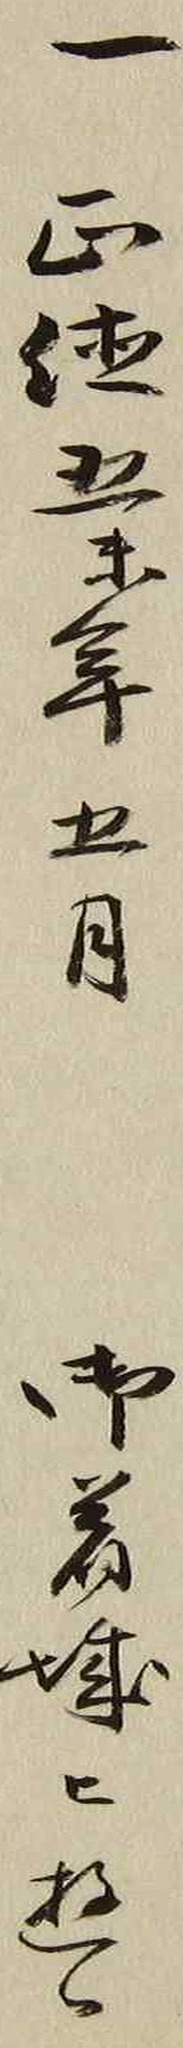一正徳五未年五月御着城被遊候
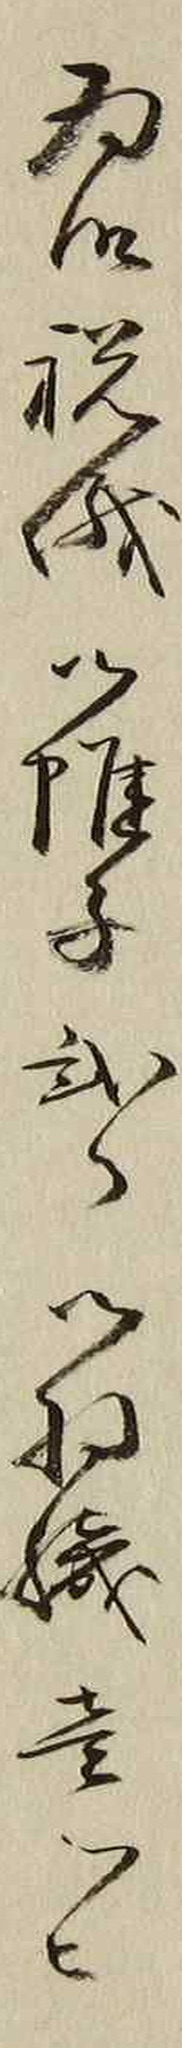為御祝儀御帷子弐つ御羽織壱つ被
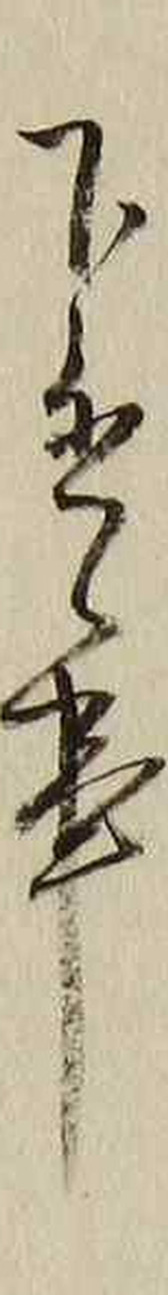下置候事
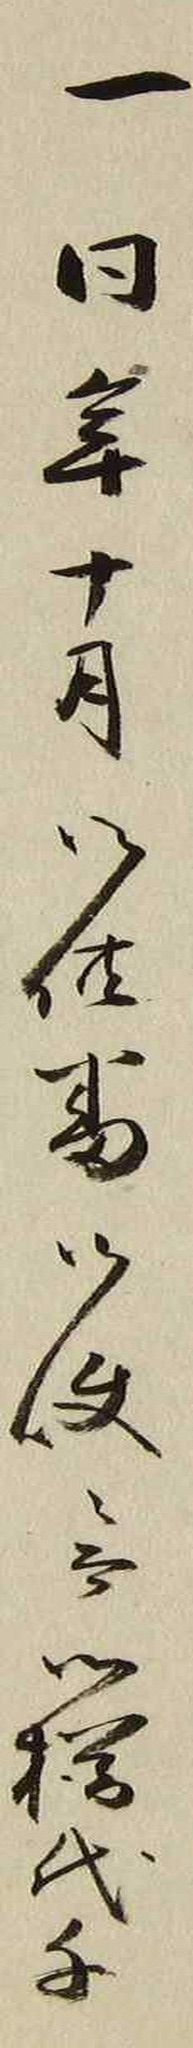一同年十月御供番御使に而御樽代千
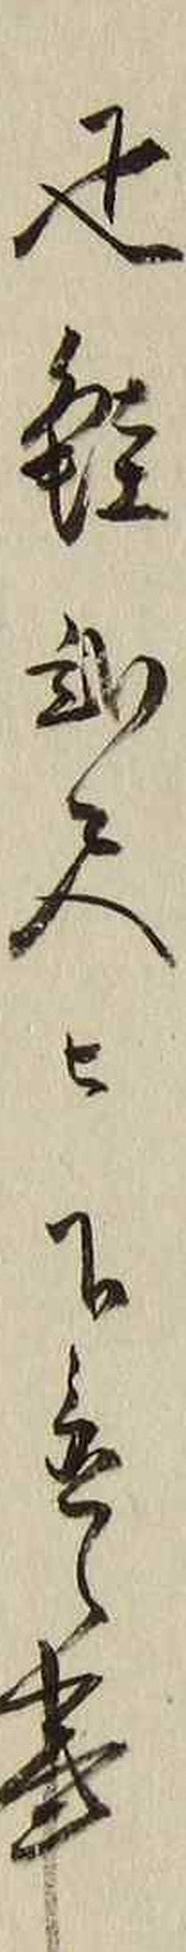疋鮭弐尺被下置候事
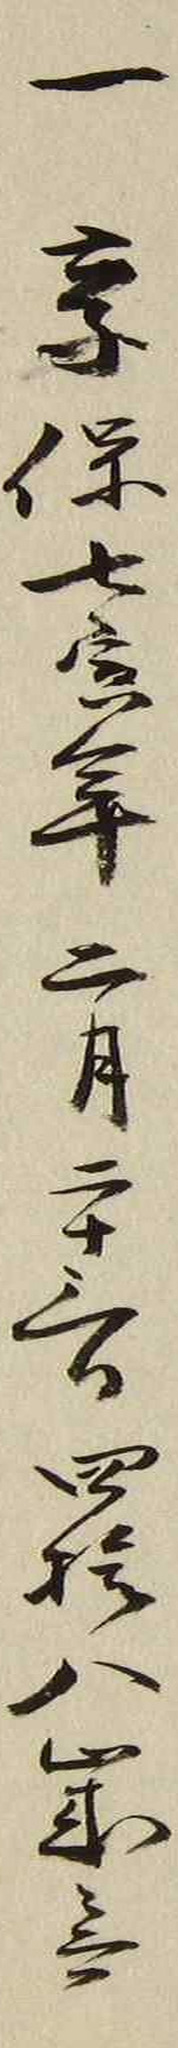一享保七寅年二月二十三日四拾八歳に而
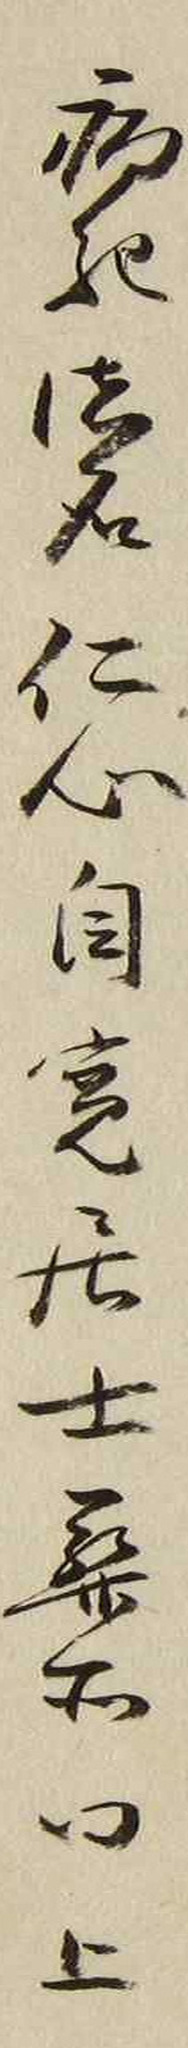病死法名仁心自寛居士葬所同上

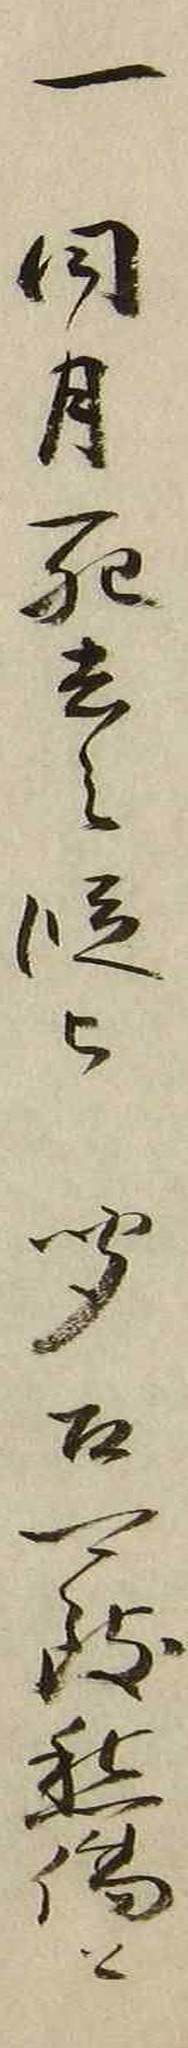一同月死去之段被聞召可致愁傷と
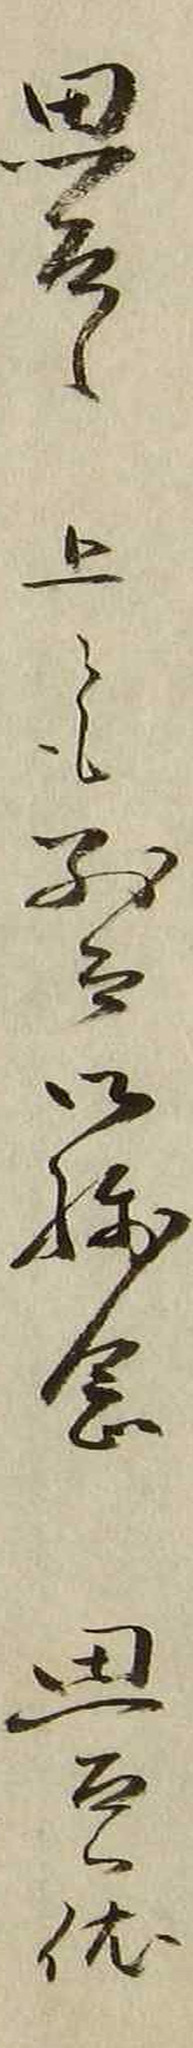思召候上にも別而御残念思召候伏
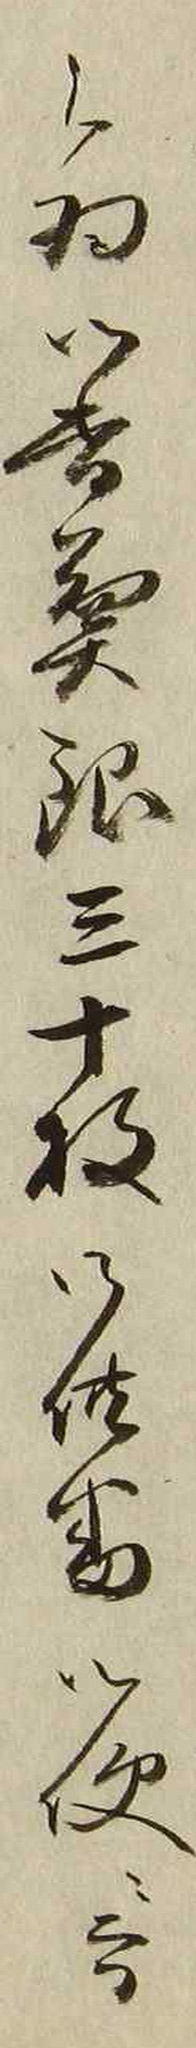之為御香典銀三十枚御供番御使に而
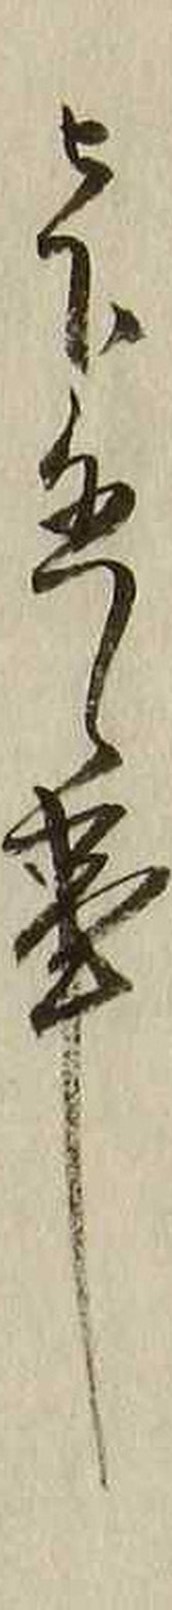被下置候事
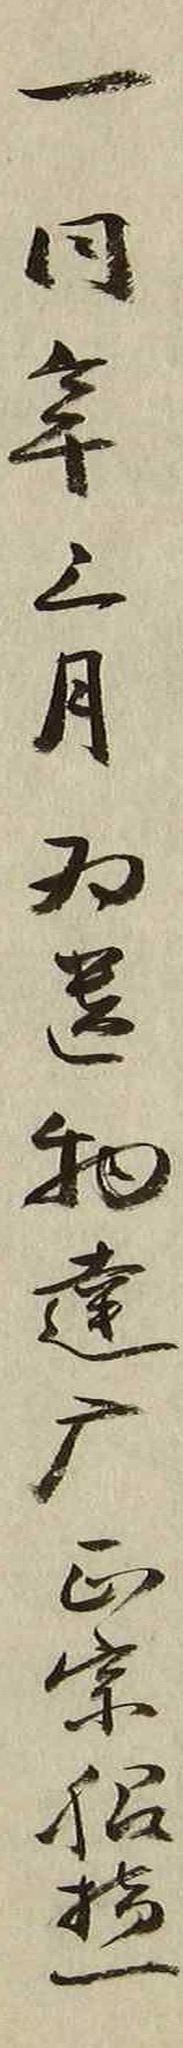一同年三月為遺物達磨正宗脇差一
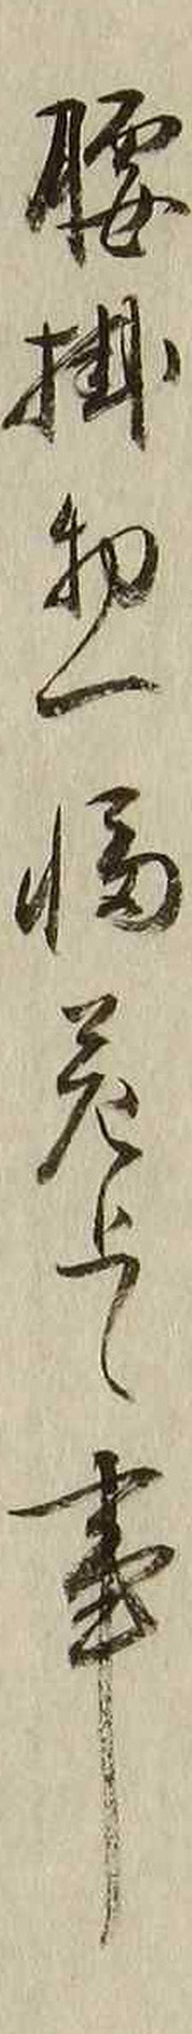腰掛物一輻差上候事
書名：諸士系譜　巻之292　き之部1
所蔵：会津若松市立会津図書館
